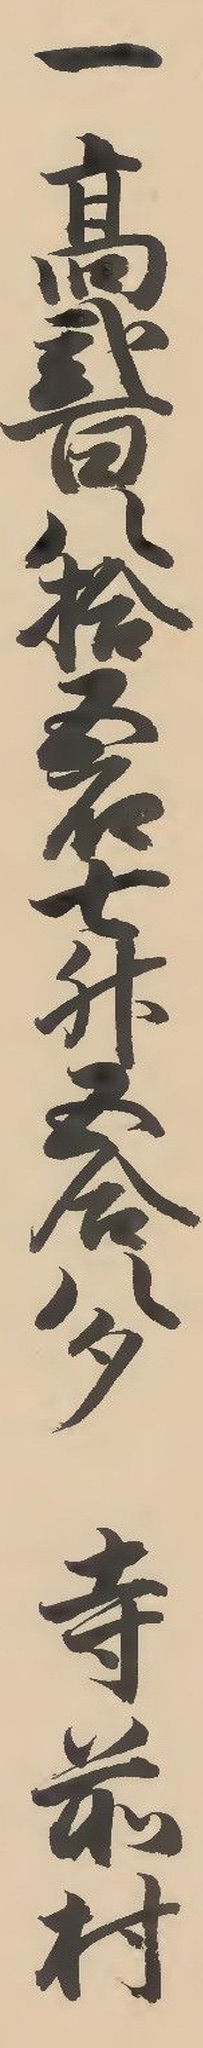一髙弐百八拾五石七升五合八夕寺前村
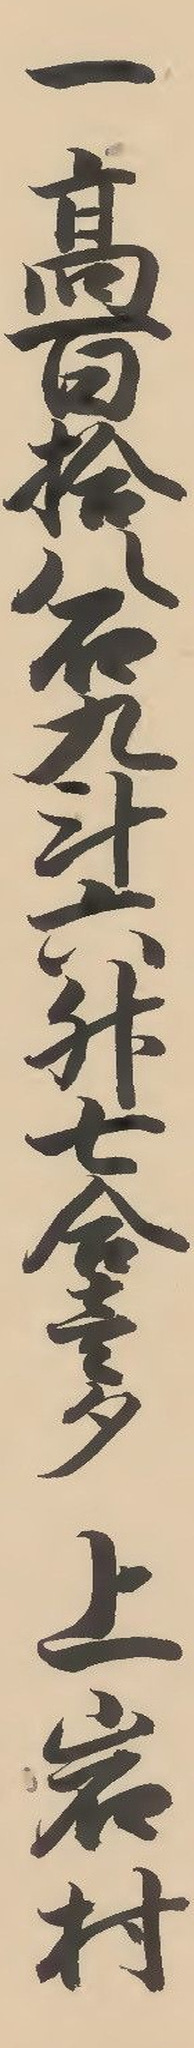一髙百拾八石九斗六升七合壱夕上岩村
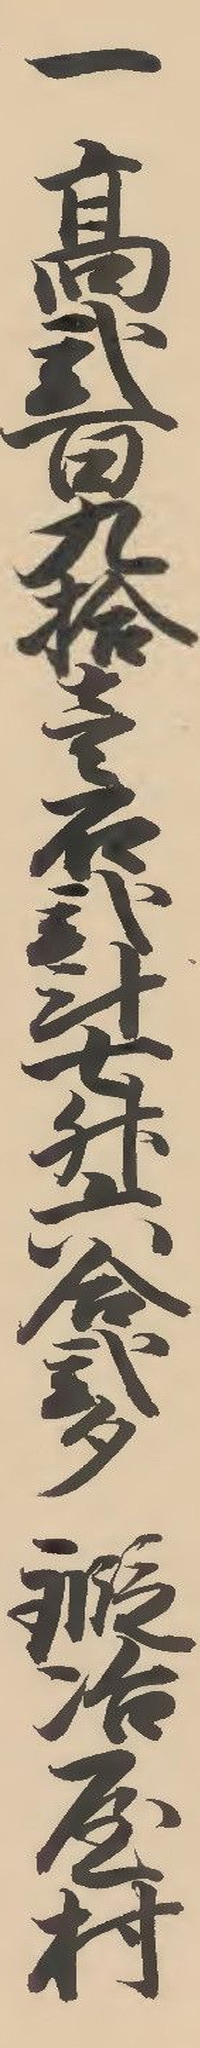一髙弐百九拾壱石弐斗七升六合弐夕鍛冶屋村
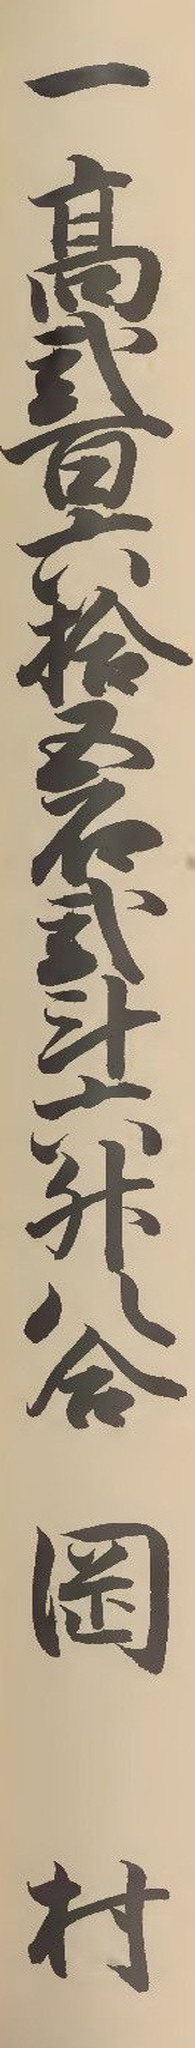一髙弐百六拾五石弐斗六升八合岡村
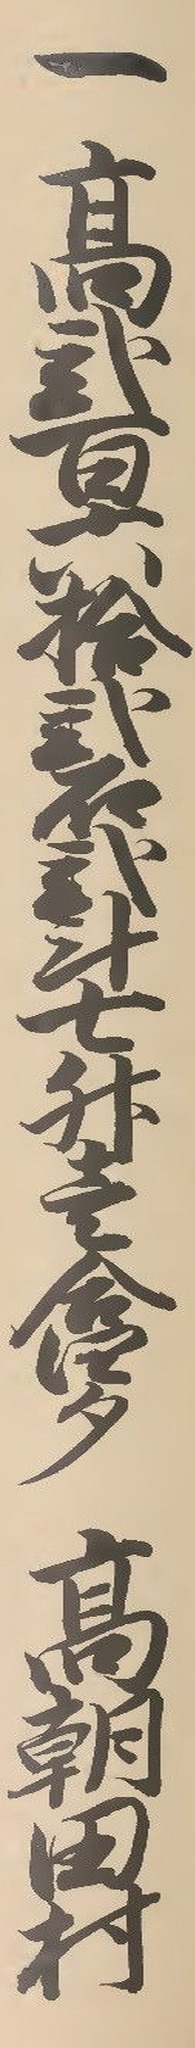一髙弐百六拾弐石弐斗七升壱合四夕髙朝田村
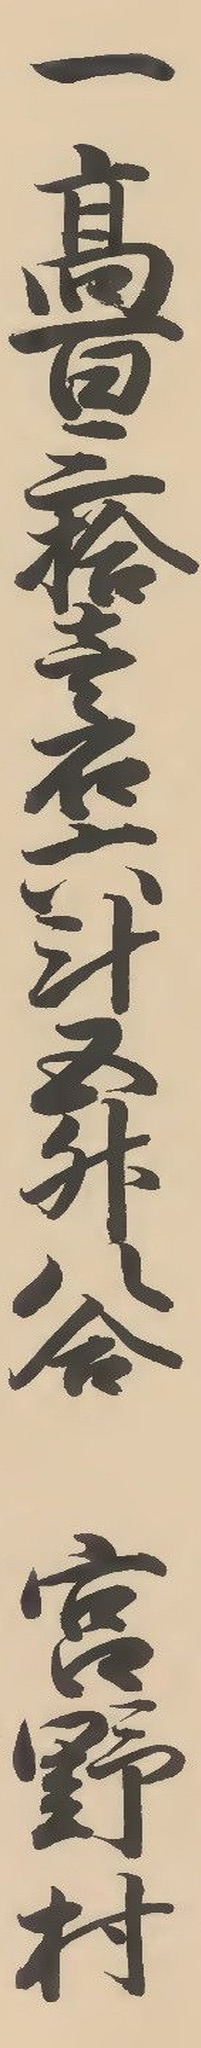一髙百三拾壱石六斗五升八合宮野村
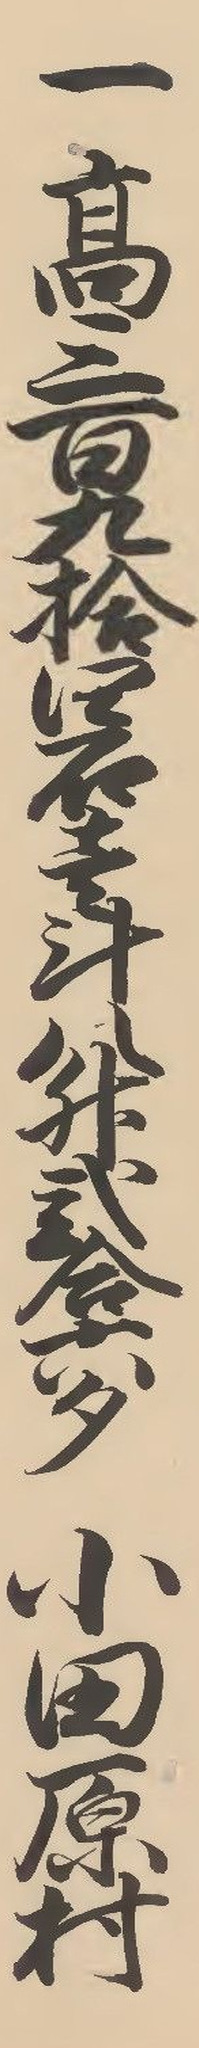一髙三百九拾四石壱斗八升弐合六夕小田原村
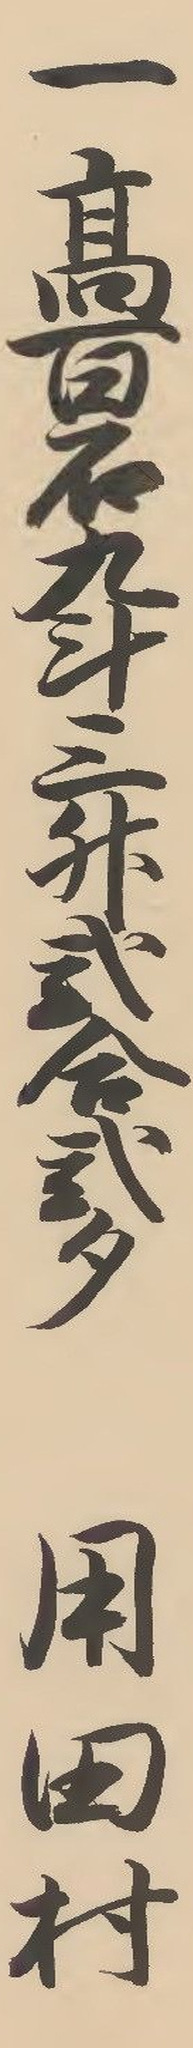一髙百石九斗三升弐合弐夕用田村

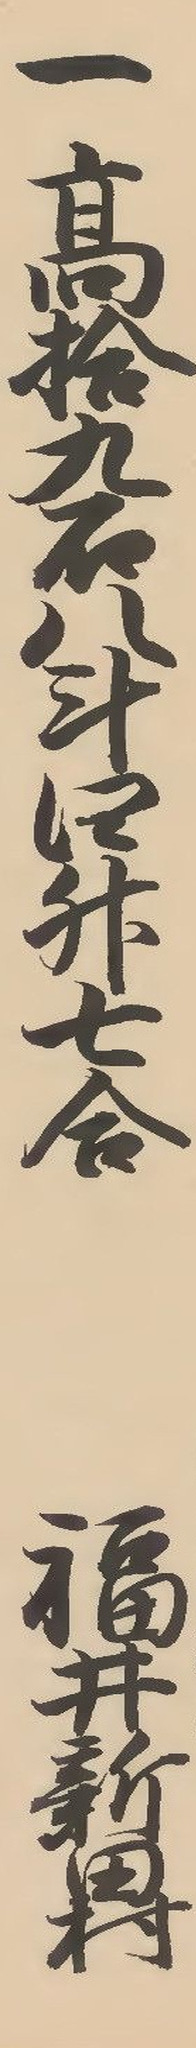一髙拾九石八斗四升七合福井新田村
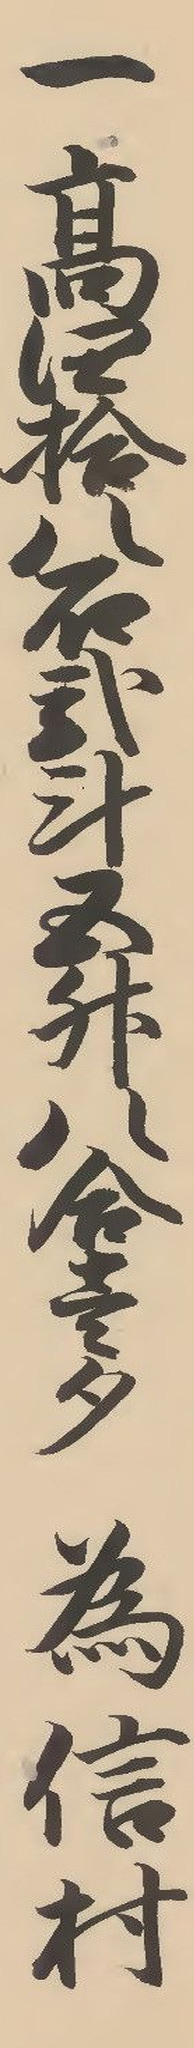一髙四拾八石弐斗五升八合壱夕為信村
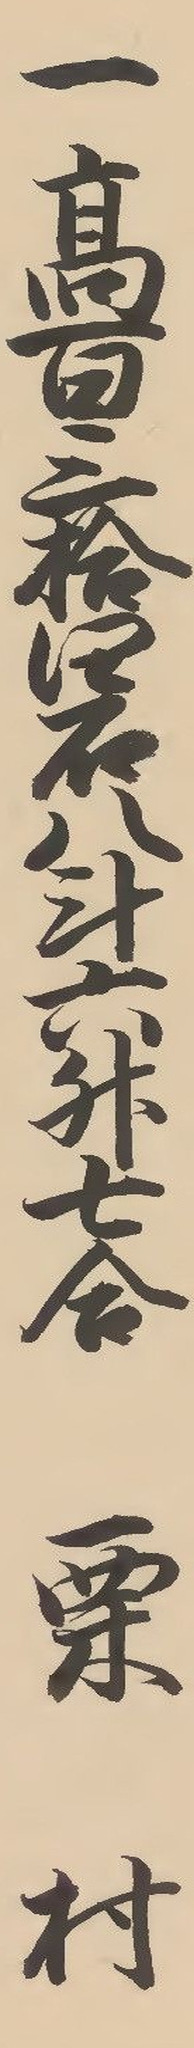一髙百三拾四石八斗六升七合栗村
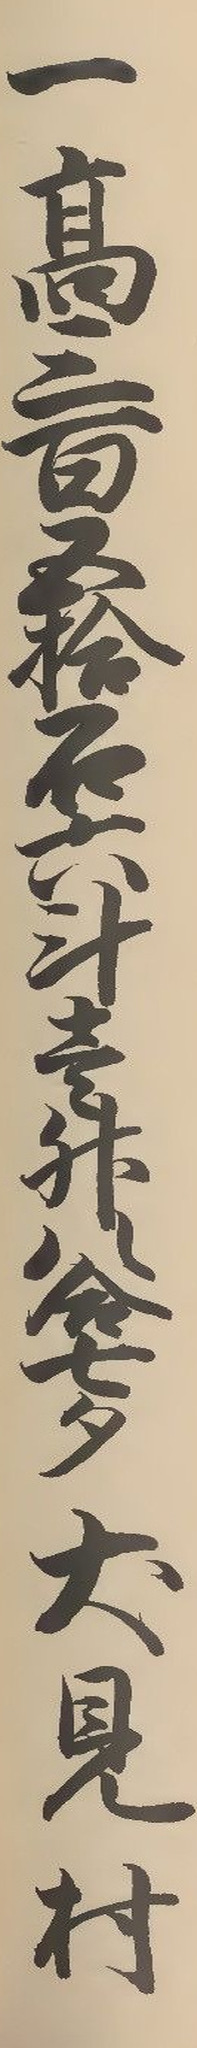一髙三百五拾石六斗壱升八合七夕犬見村
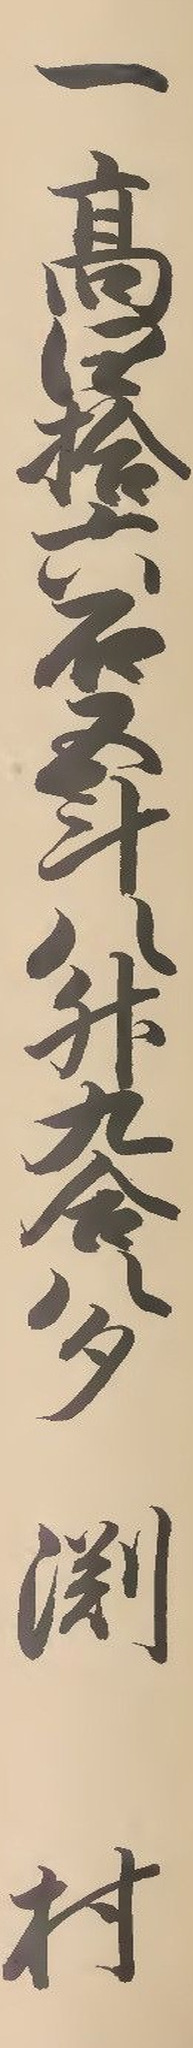一髙四拾六石五斗八升九合八夕渕村
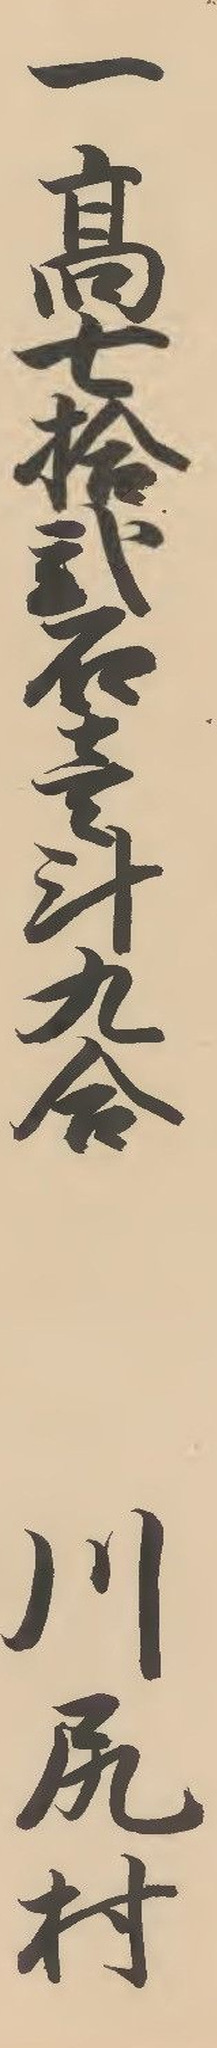一髙七拾弐石壱斗九合川尻村
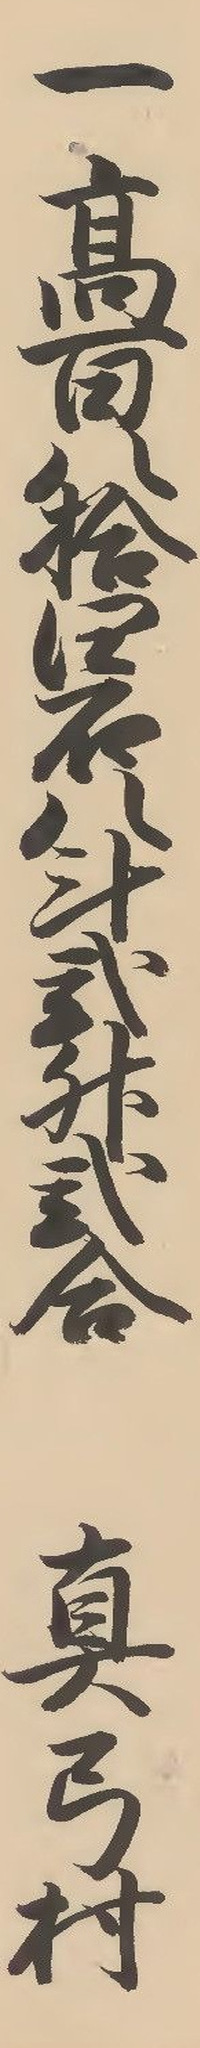一髙百八拾四石八斗弐升弐合真弓村
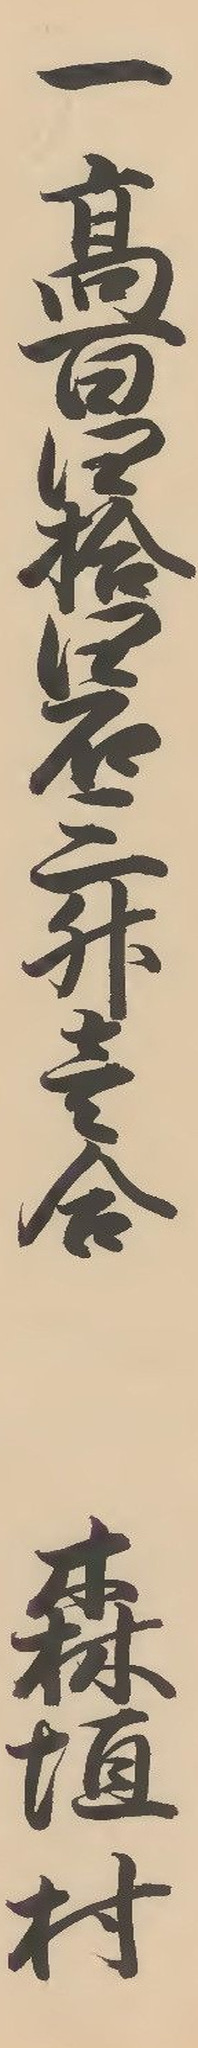一髙百四拾四石三升壱合森垣村
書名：播磨国郷帳
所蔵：国立公文書館 National Archives of Japan
